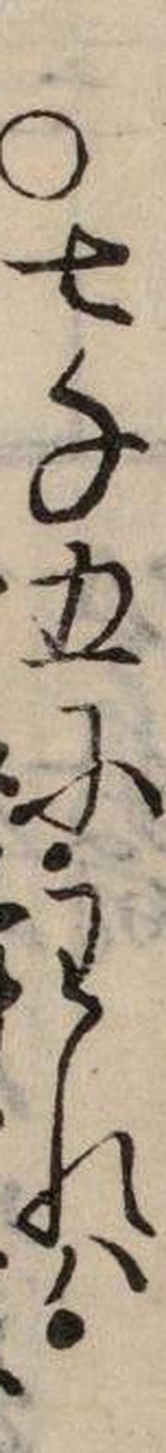⚪︎七千五にわれは
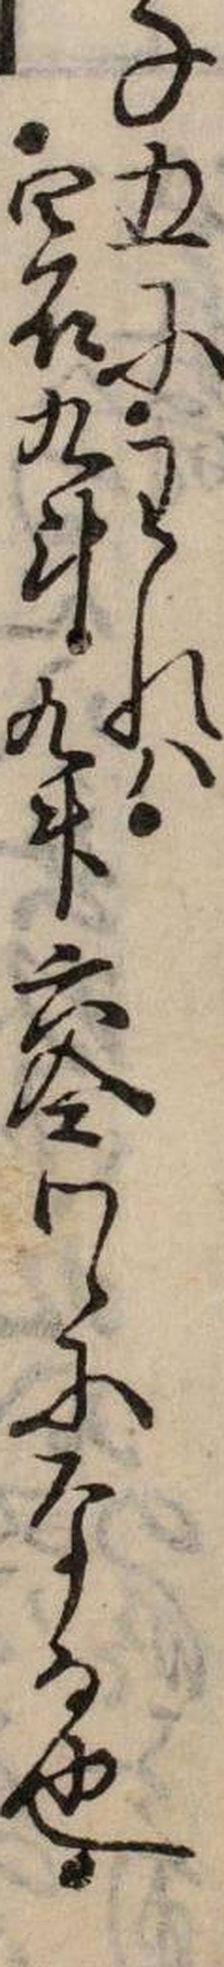・四石九斗九升六合つゝになる也
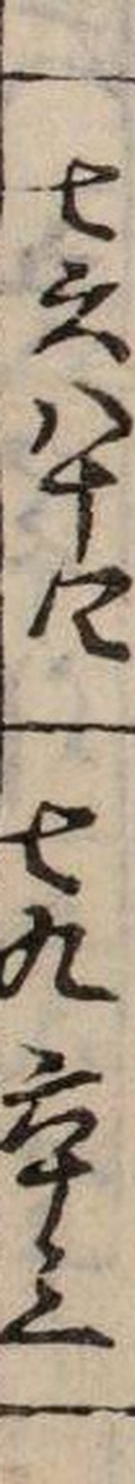千４七六八十四七九六十三

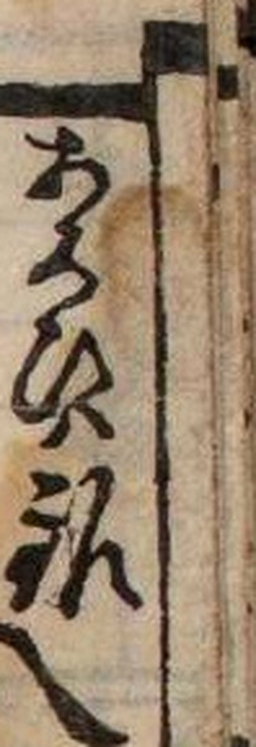あるひは銀
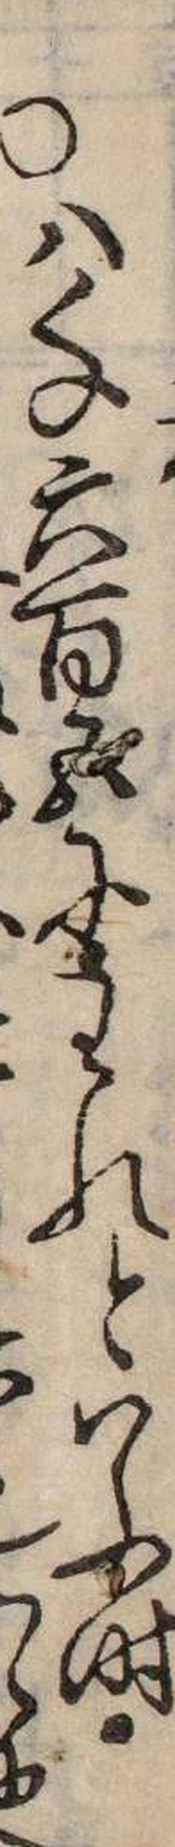⚪︎八千六百五にわれといふ時・
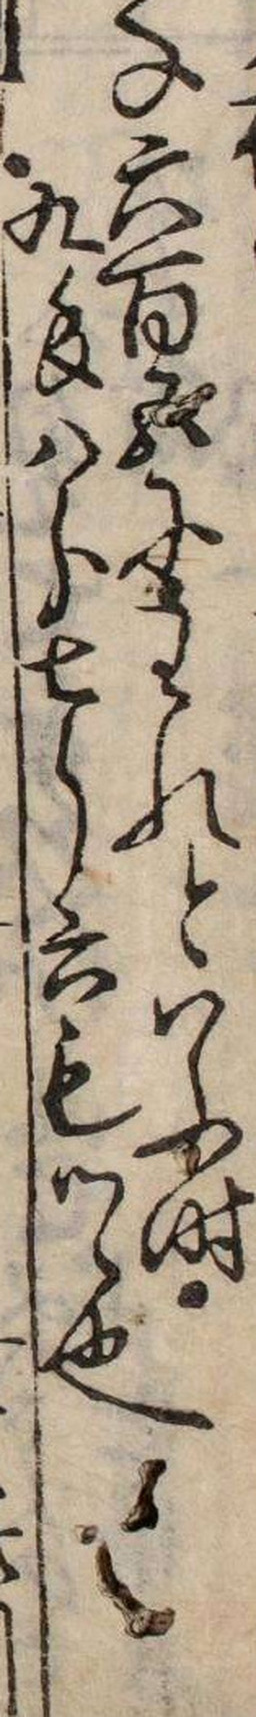・九匁八分七里六毛つゝ也
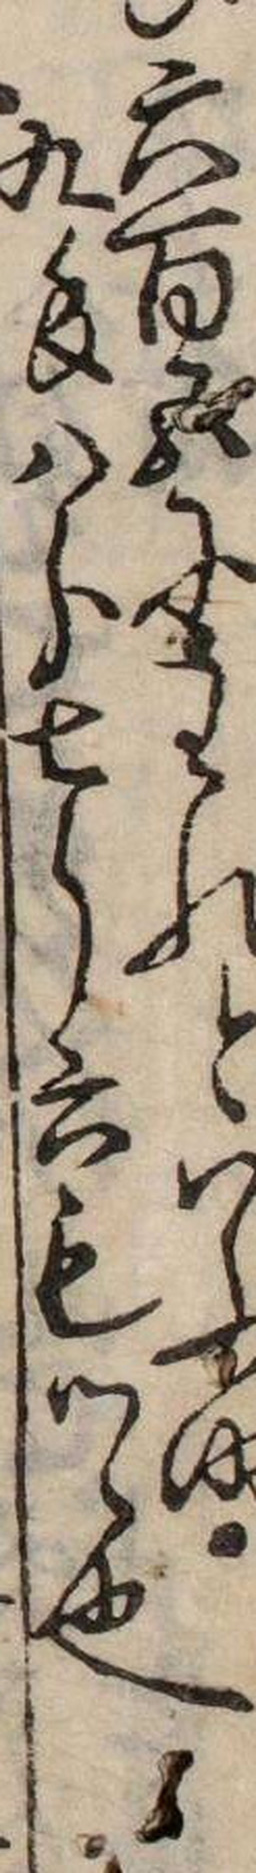・九匁八分七里六毛つゝ也
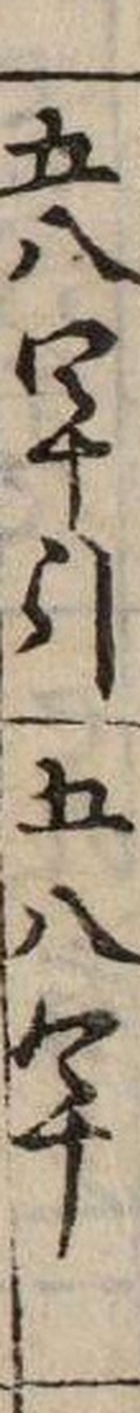五八四十五八四十引
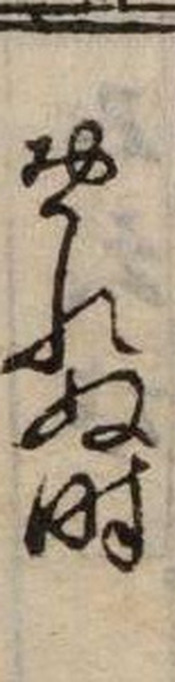おかれぬ時
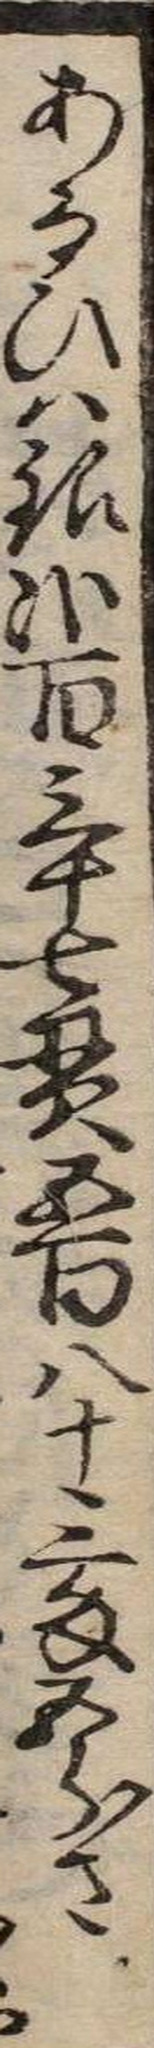あるひは銀弍百三十七貫五百八十三匁五分を
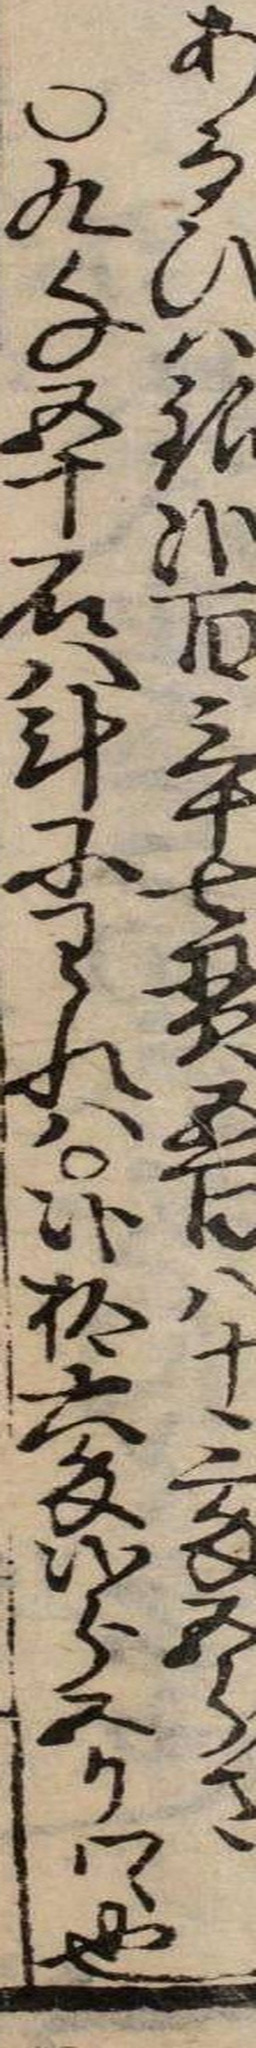⚪︎九千五十石八斗にわれは⚪︎弍拾六匁弍分五里つゝ也
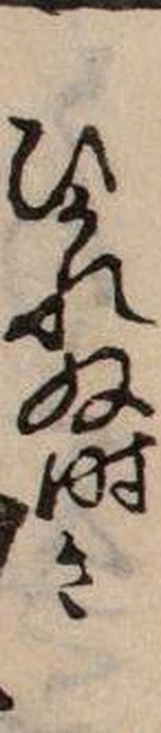おかれぬ時

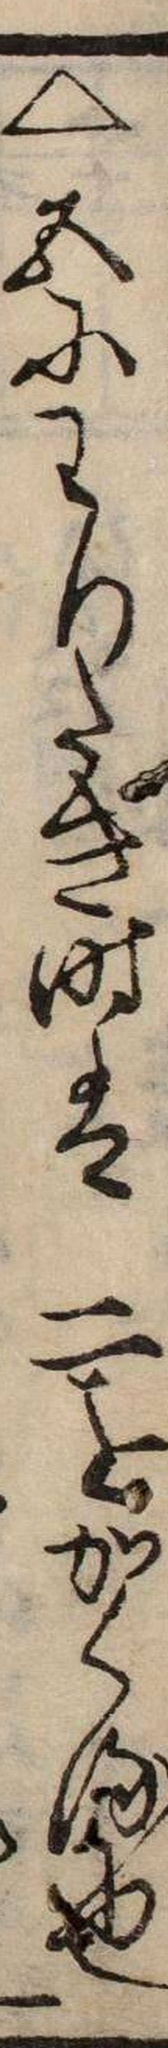△五にわりたき時には二をかくる也
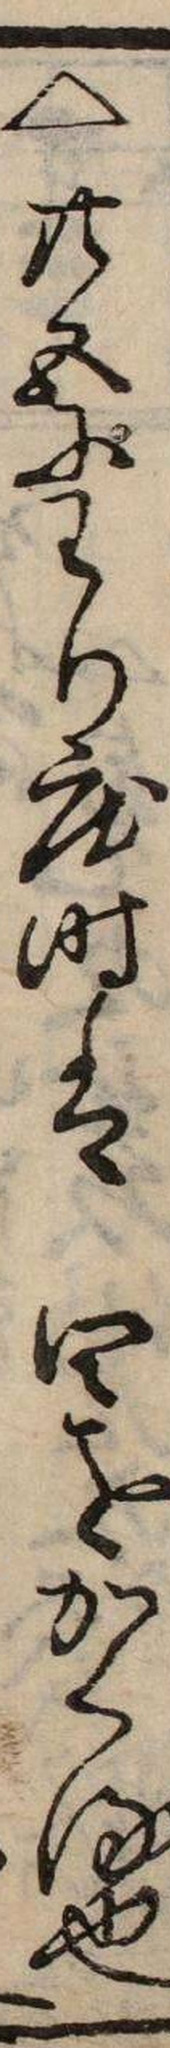△廿五にわり度時には四をかくる也
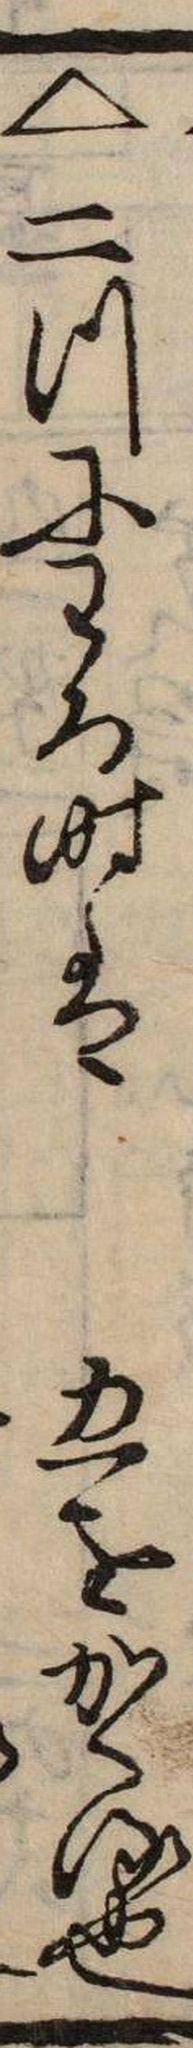△二つにわる時には五をかくる也
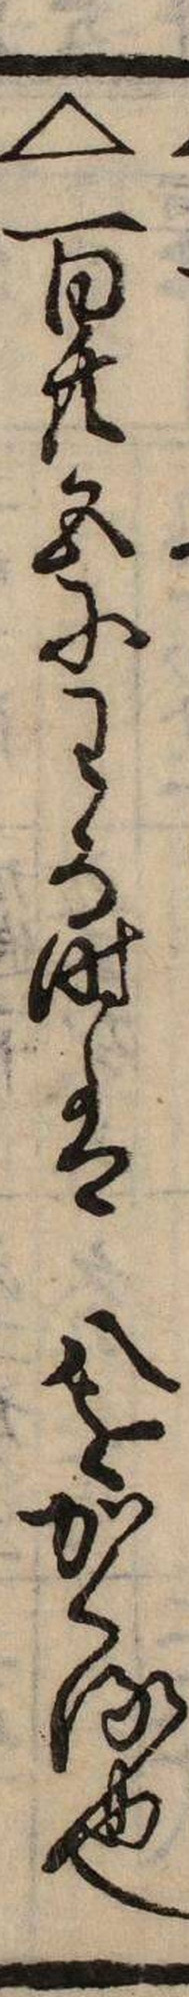△百廿五にわる時には八をかくる也
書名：塵劫記（寛永11年自跋、京都府立京都学・歴彩館追貴8）
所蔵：京都府立京都学・歴彩館 国文学研究資料館
